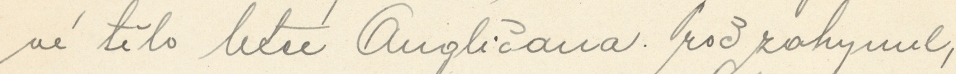vé tělo letce Angličana. Proč zahynul,
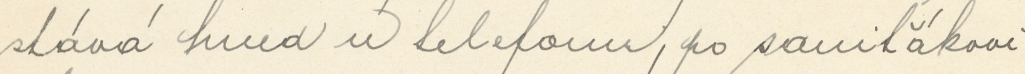stává hned u telefonu, po saniťákovi
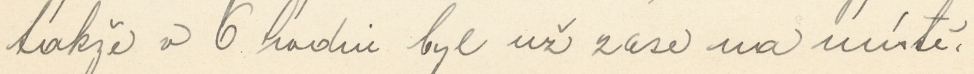takže v 6 hodin byl už zase na místě.
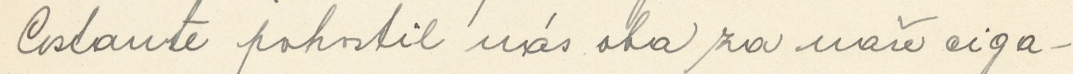Cestante pohostil nás oba za naše ciga-
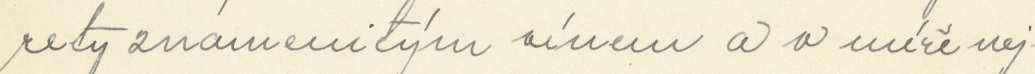rety znamenitým vínem a v míře nej-
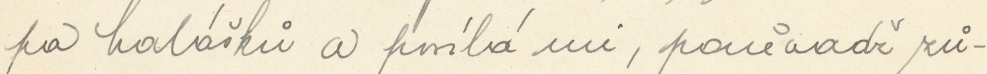pa Malášků a posílá mi, poněvadž zů-
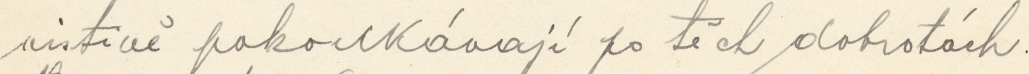vistivě pokoukávají po těch dobrotách.
